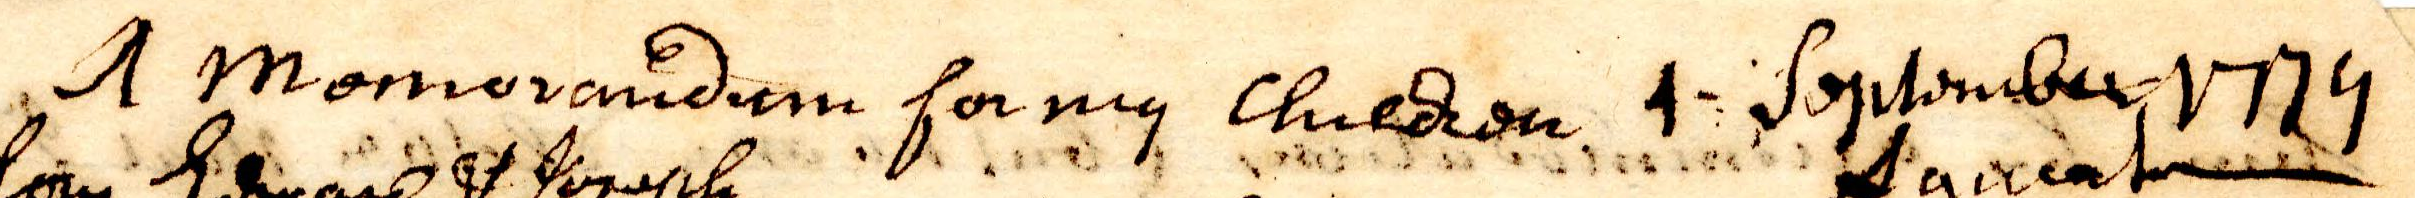A Memorandum for my Children 1- September-1779
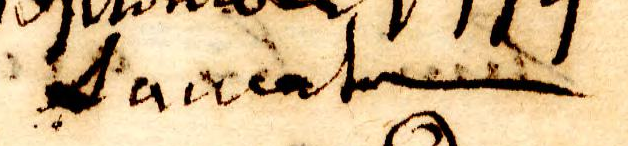Lancaster
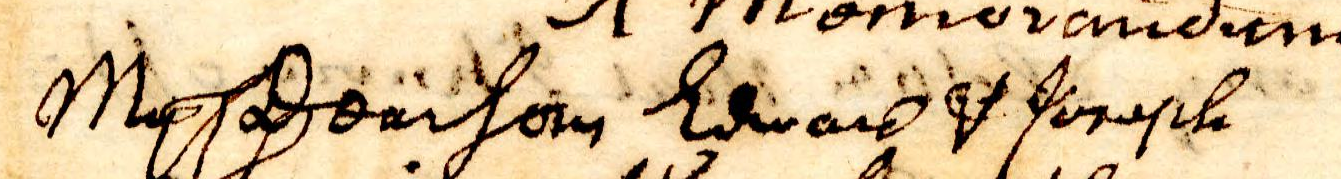My Dear Sons Edward & Joseph
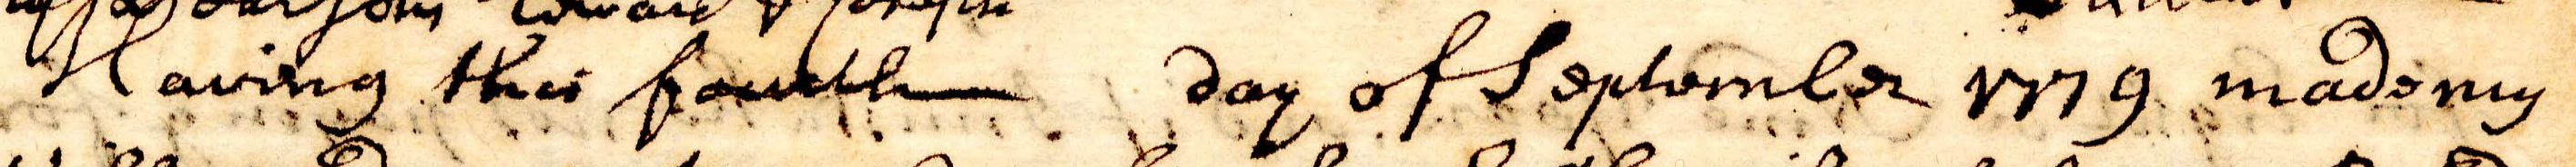Having this fourth day of September 1779 made my
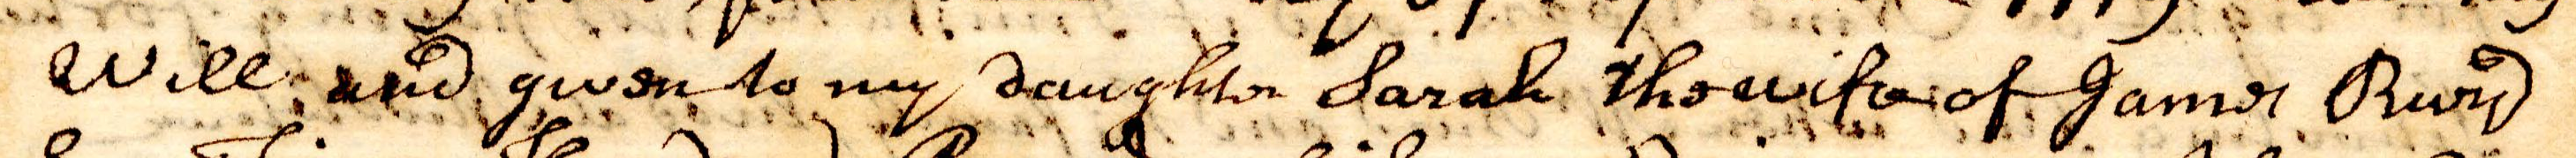Will and given to my daughter Sarah the wife of James Burd
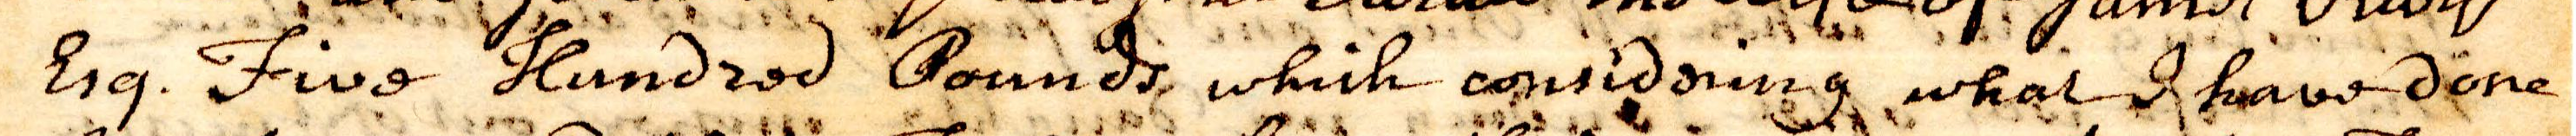Esq. Five Hundred Pounds which considering what I have done
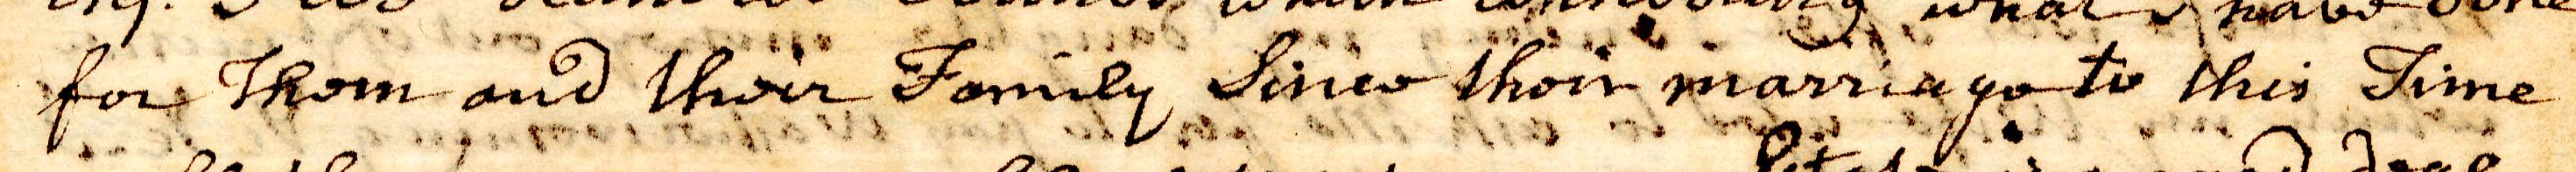for Them and their Family Since their marriage to this Time
